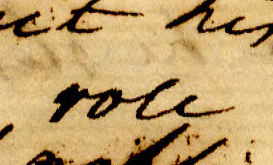roll
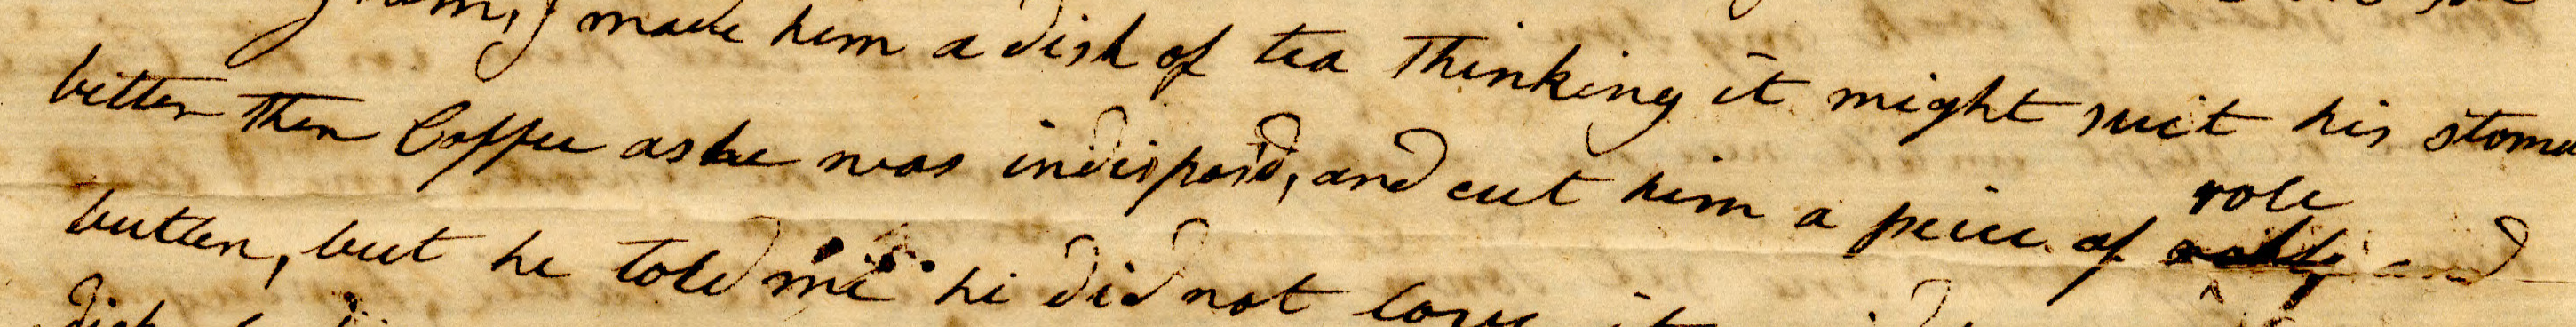better than Coffee as he was indispos'd, and cut him a peice of [roll] ^ and
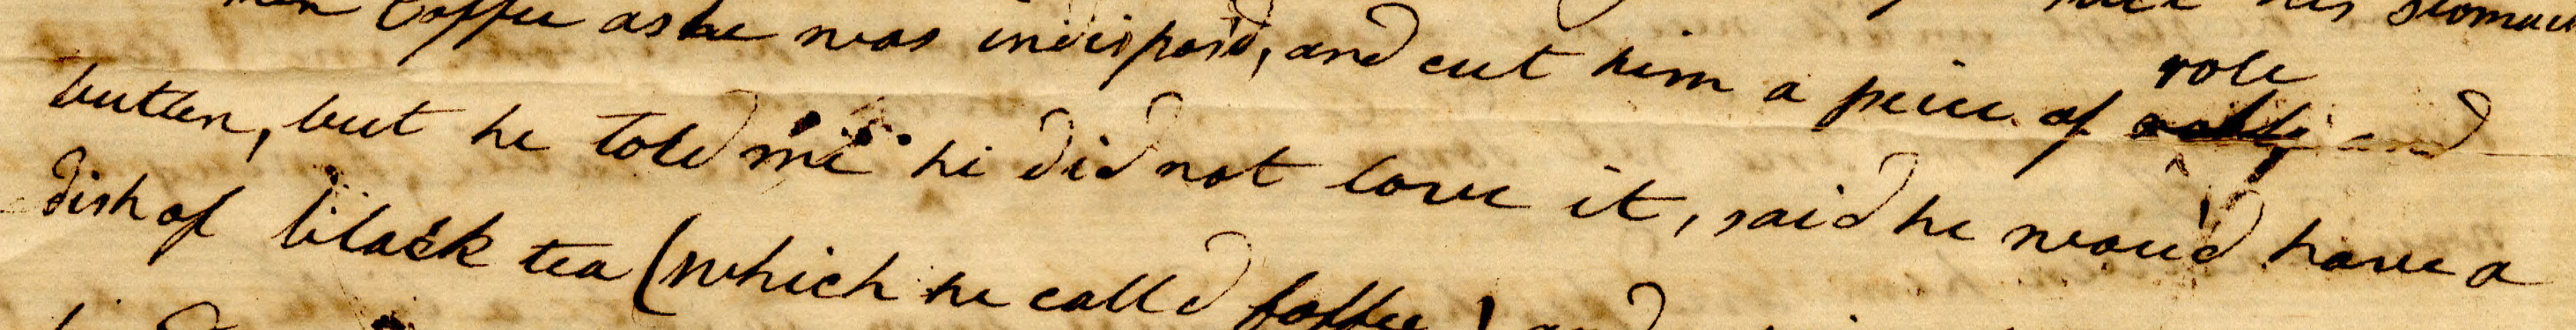butter, but he told me he did not love it, said he woud have a
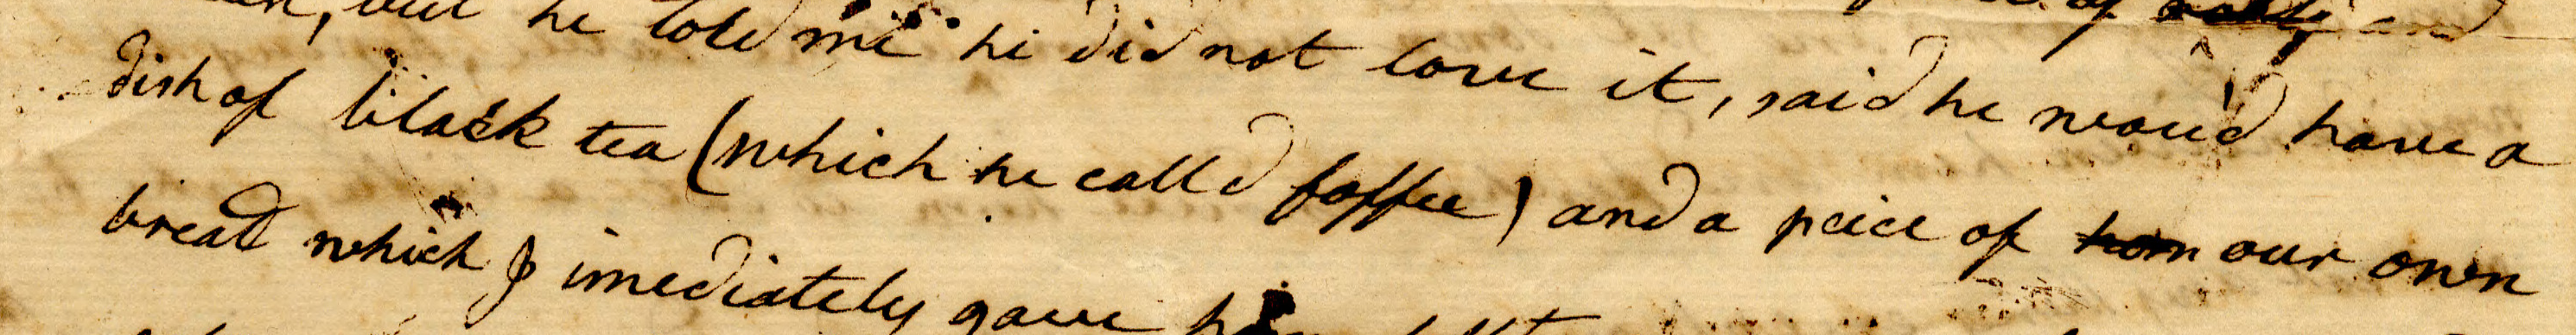dish of black tea (which he calld Coffee) and a peice of [torn] our own
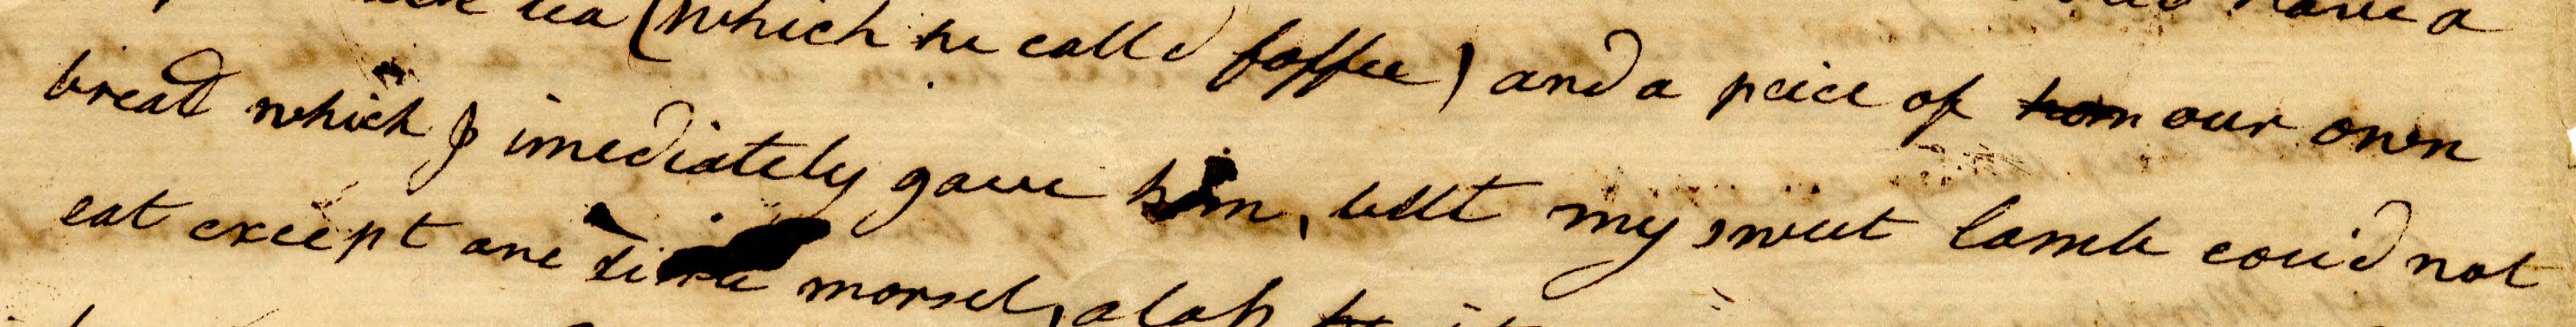bread which I imediately gave him, but my sweet lamb cou'd not
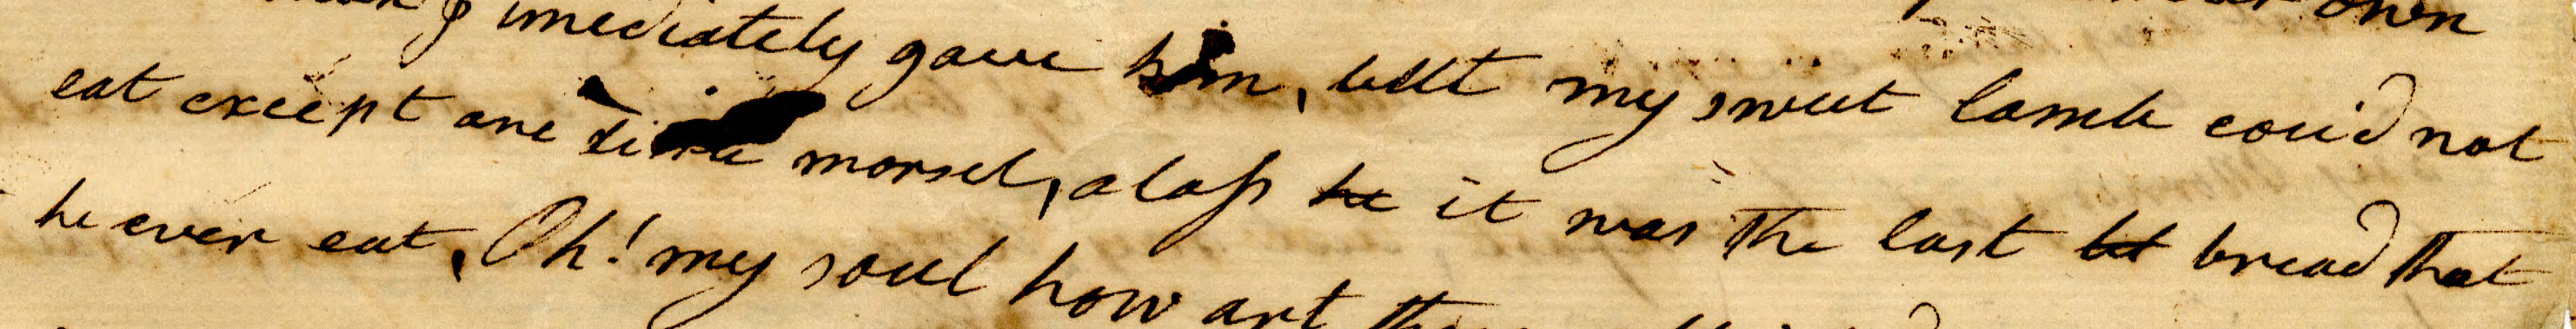eat except one little morsel, alas it was the last bread that
